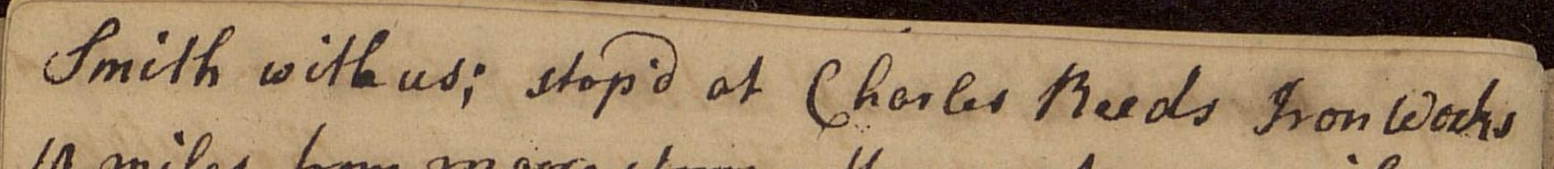Smith with us; stop'd at Charles Reeds Iron Works
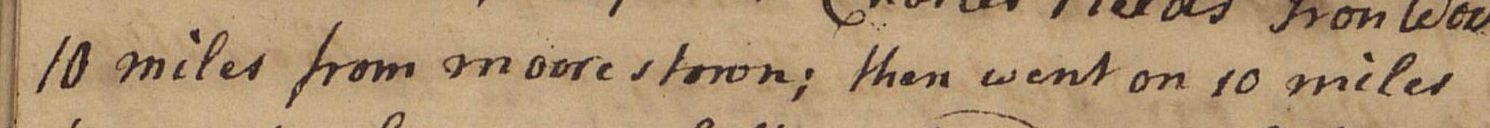10 miles from moorestowon; then went on 10 miles
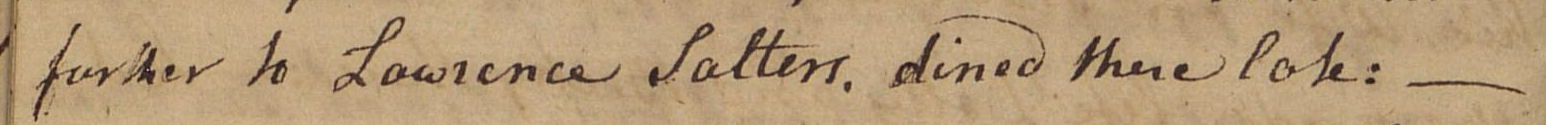further to Lawrence Salters, dined there lose:-
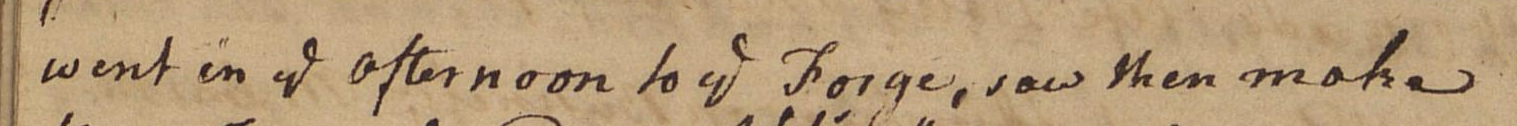went in y^e afternoon to y^e Forge, saw then make
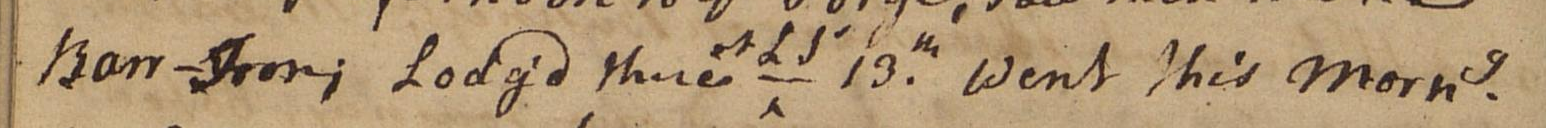Barr-Iron; Lodg'd there ^at ^LS 13^th. Went this Morn^g.
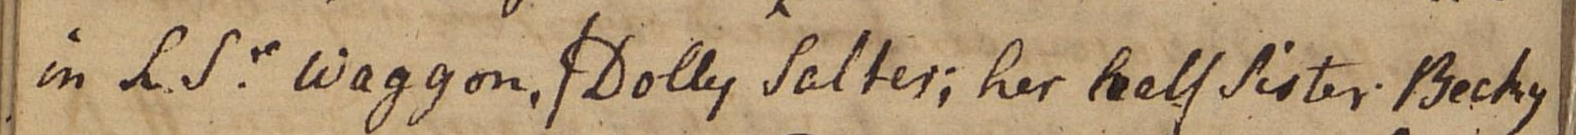in L.S.^s. Waggon, /Dolly Salter; her half Sister Becky
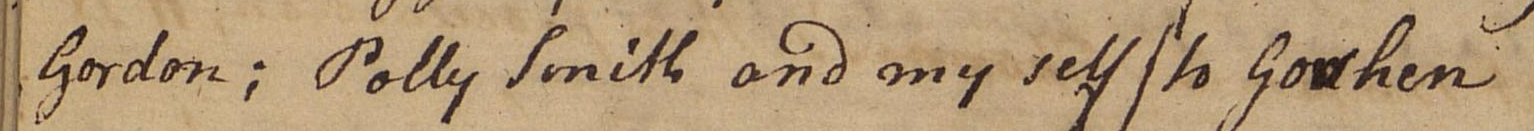Gordon; Polly Smith and my self. to Goshen
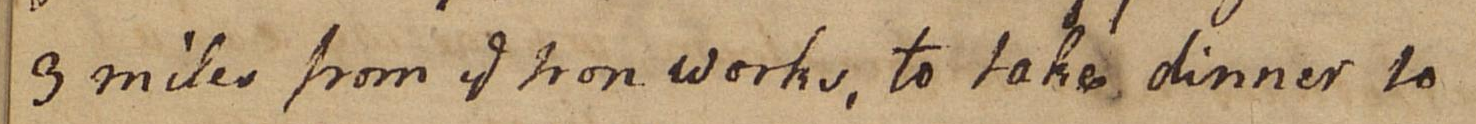3 miles from y^e Iron Works, to take dinner to
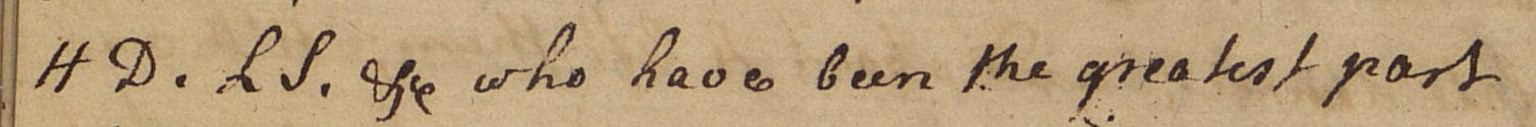HD. LS. &c who have been the greatest part
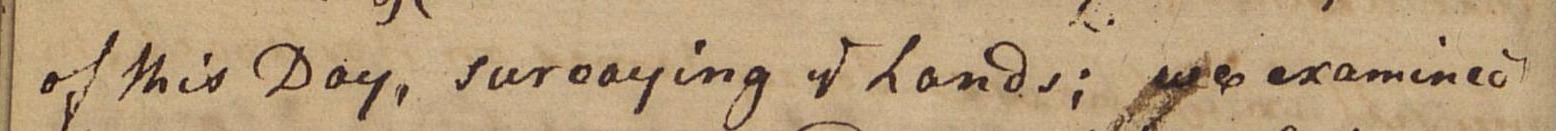of this Day, survaying y^e Lands; we examined
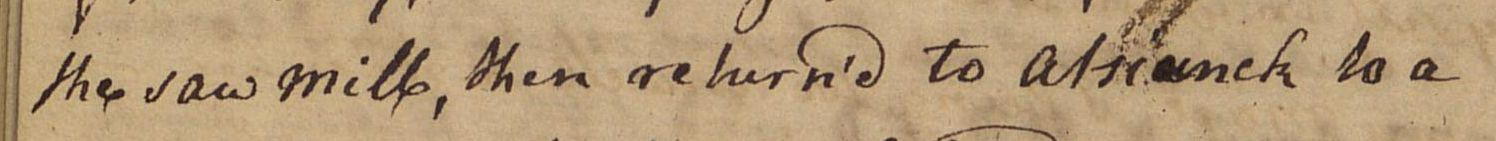the saw mill, then return'd to Atsianck to a
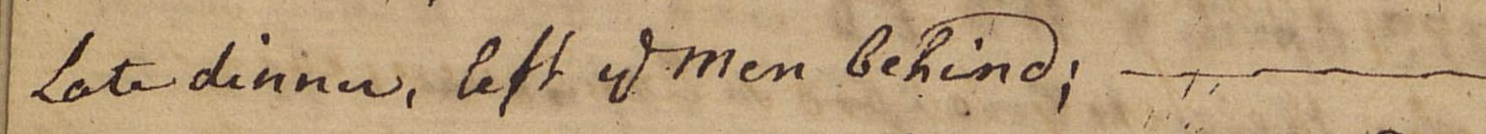late dinner, left y^e Men behind;-
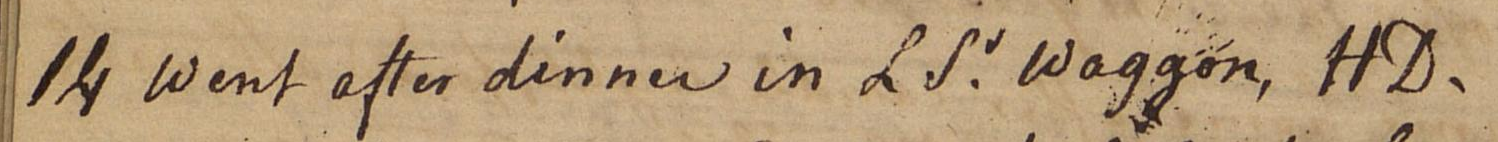14 Went after dinner in h LS^s. Waggon, HD-
